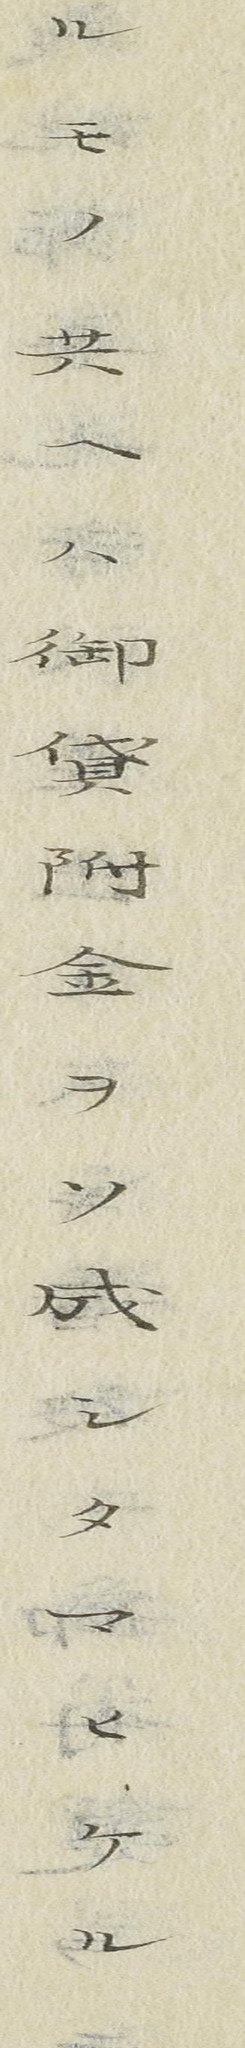ルモノ共ヘハ御貸附金ヲソ成シタマヒケル
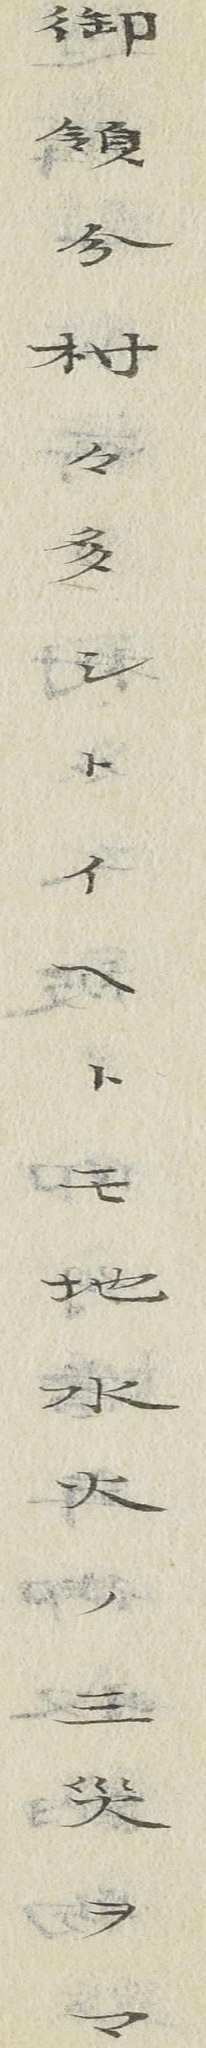〇御領分村々多シトイヘトモ地水火ノ三災ヲマ
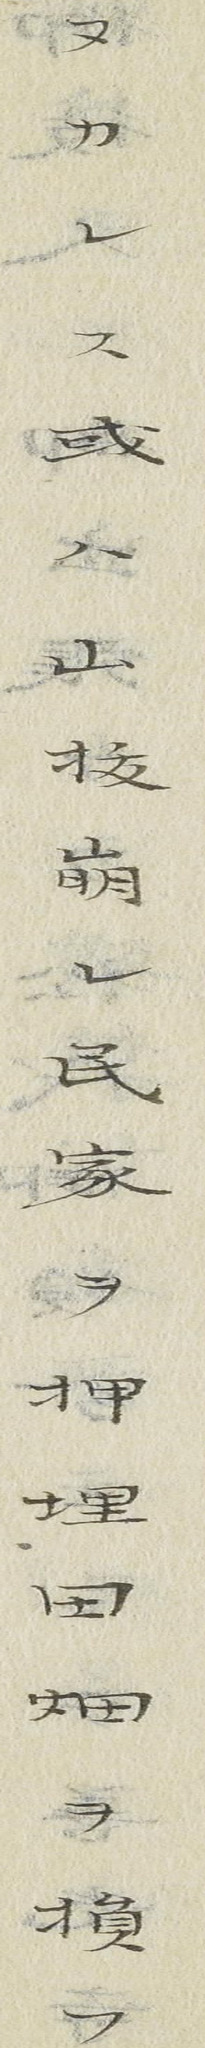ヌカレス或ハ山抜崩レ民家ヲ押埋田畑ヲ損フ
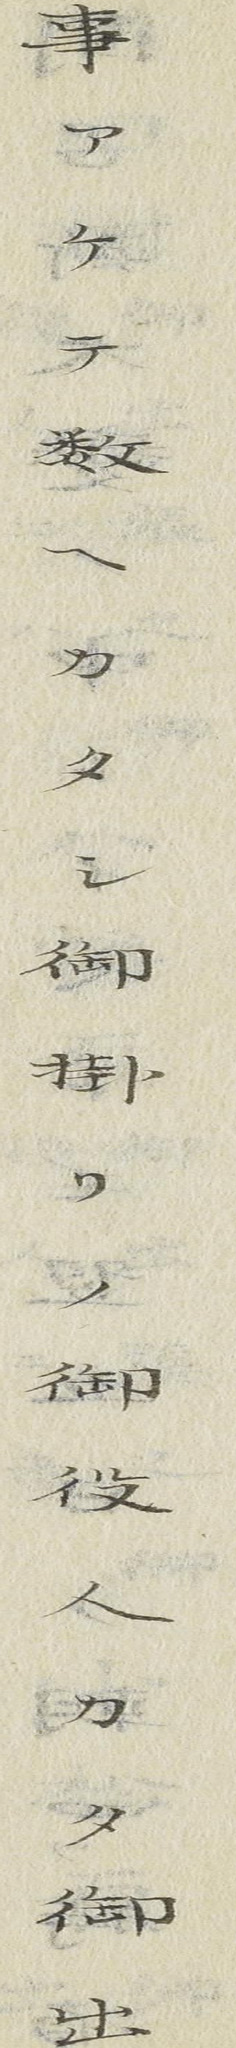事アケテ数ヘカタシ御掛リノ御役人カタ御出
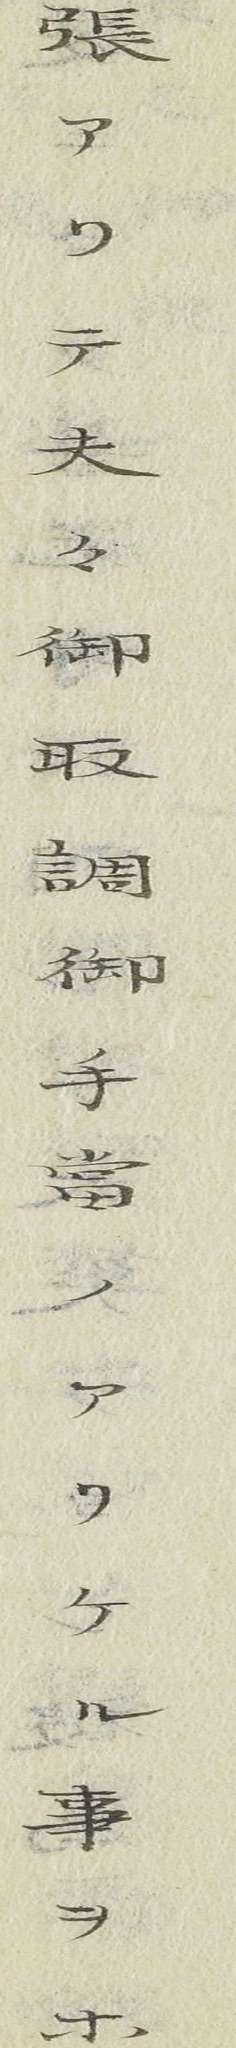張アリテ夫々御取調御手当ノアリケル事ヲホ
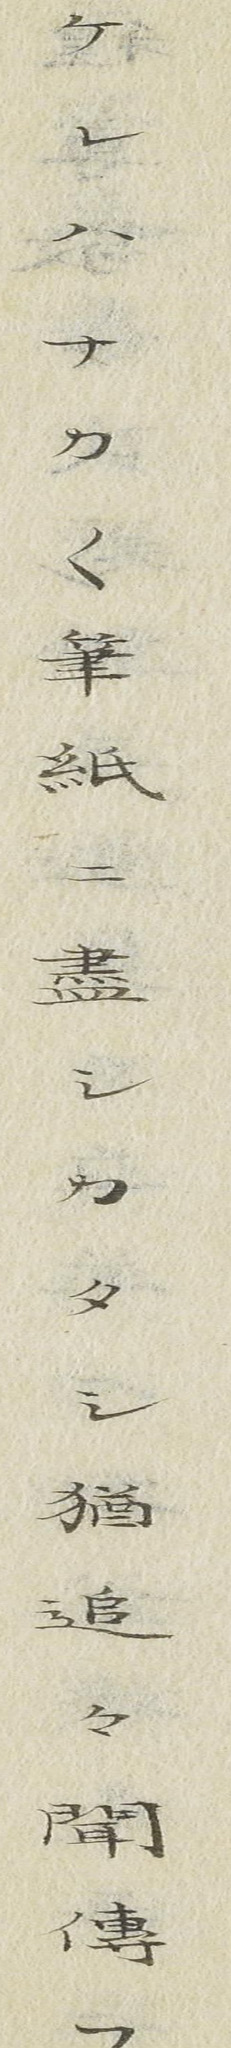ケレハナカ〱筆紙ニ尽シカタシ猶追々聞伝フ
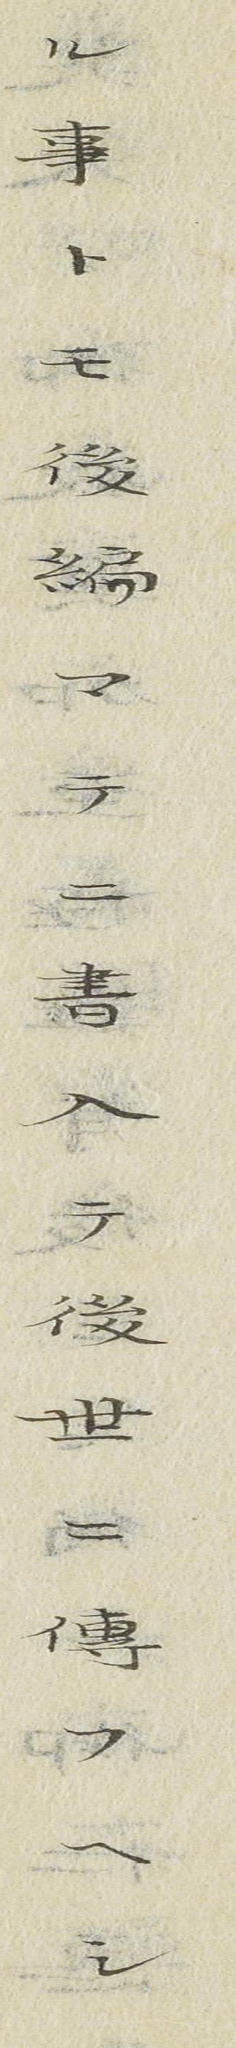ル事トモ後編マテニ書入テ後世ニ伝フヘシ
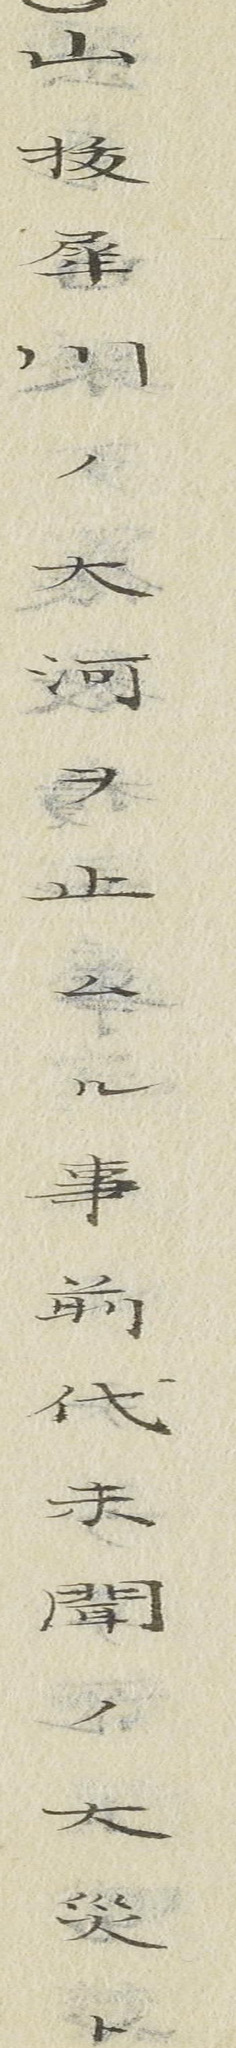〇山抜犀川ノ大河ヲ止ムル事前代未聞ノ大変ト
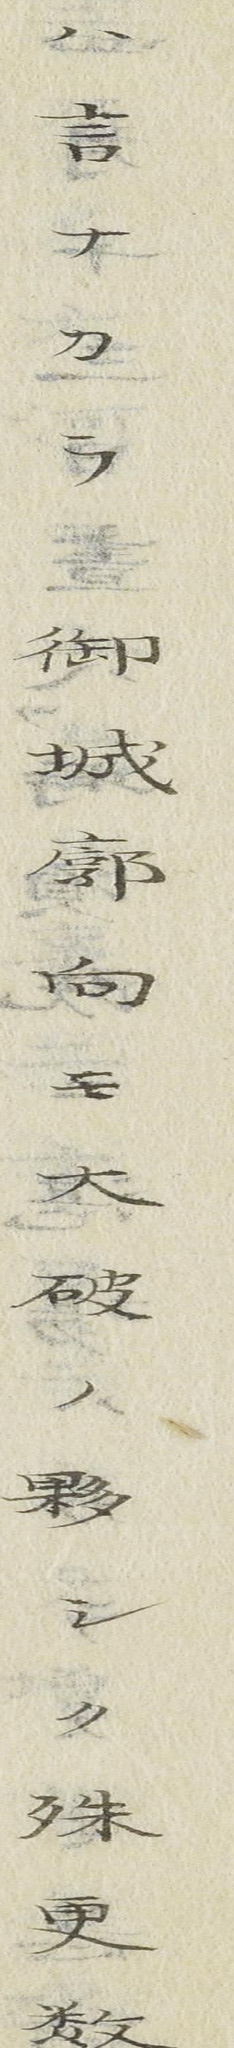ハ言ナカラ御城郭向モ大破ノ夥シク殊更数
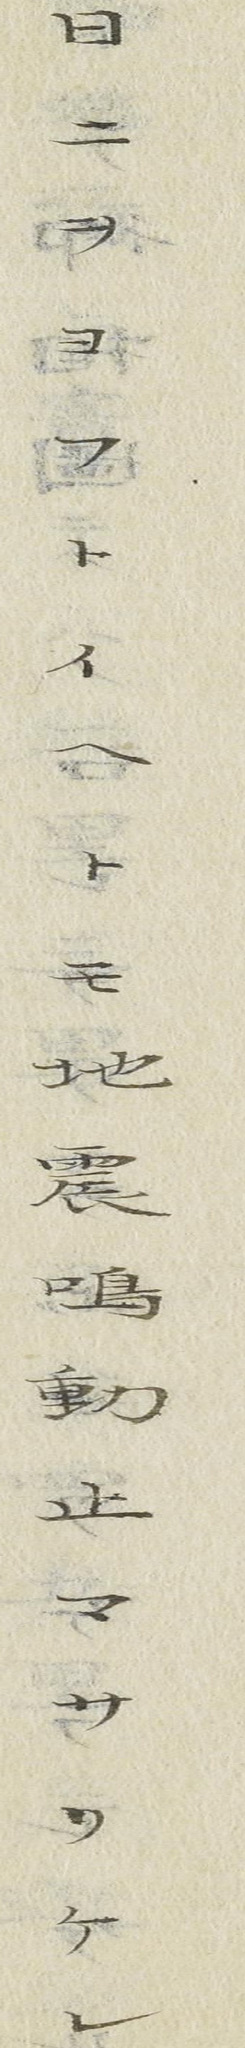日ニヲヨフトイヘトモ地震鳴動止マサリケレ
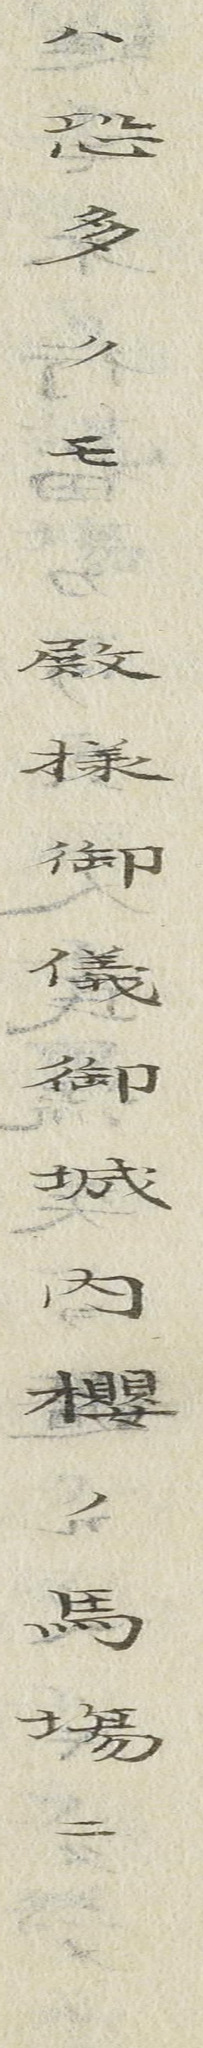ハ恐多クモ殿様御儀御城内桜ノ馬場ニ
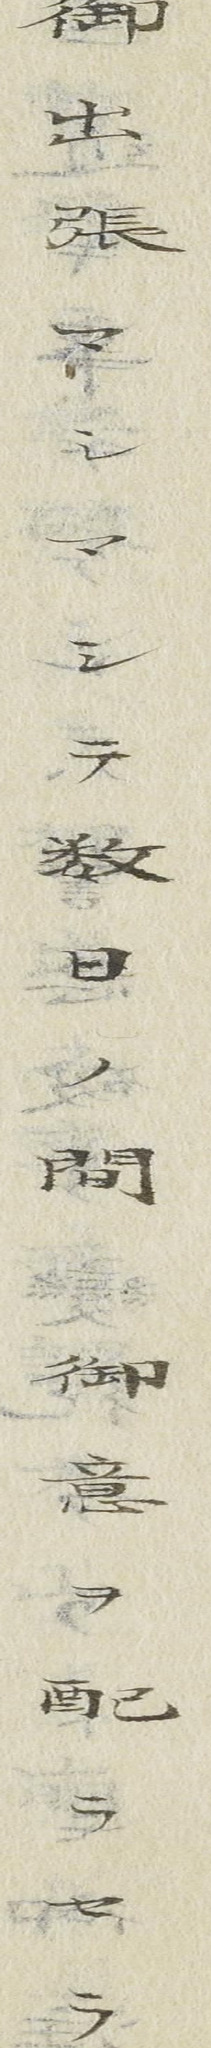御出張マシマシテ数日ノ間御意ヲ配ラセラ
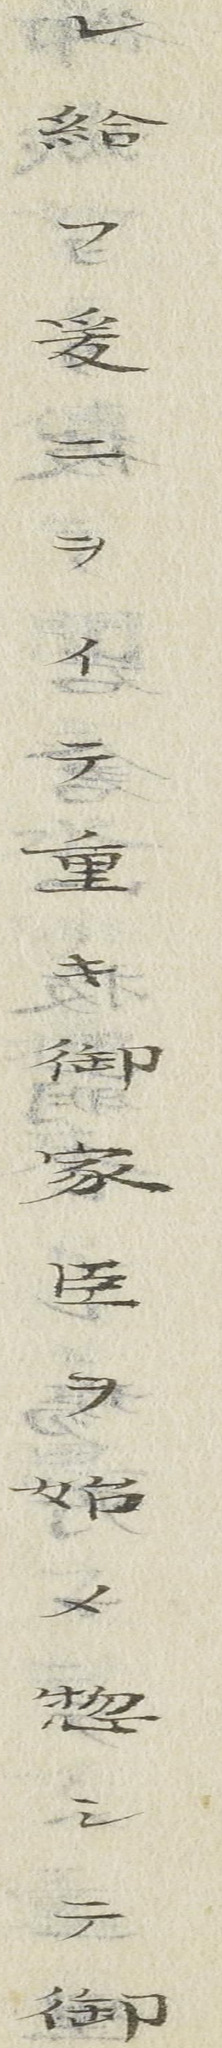レ給フ爰ニヲイテ重キ御家臣ヲ始メ惣シテ御
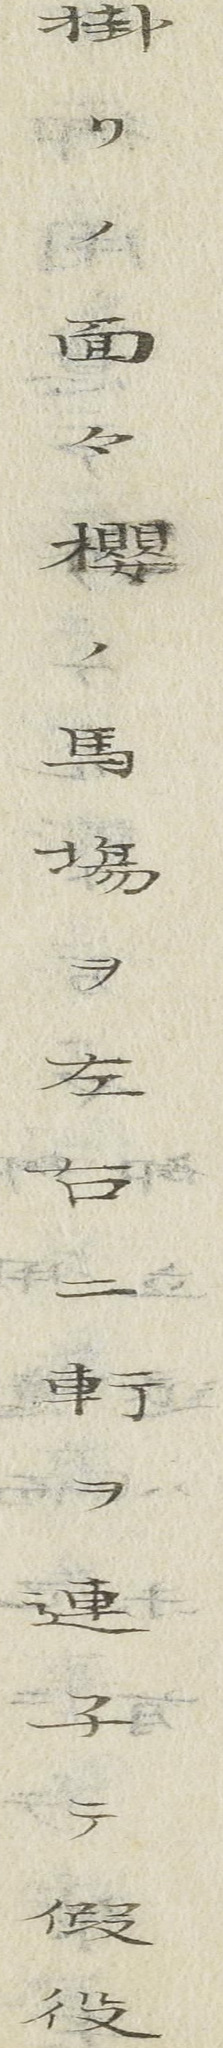掛リノ面々桜ノ馬場ヲ左右ニ軒ヲ連子テ仮役
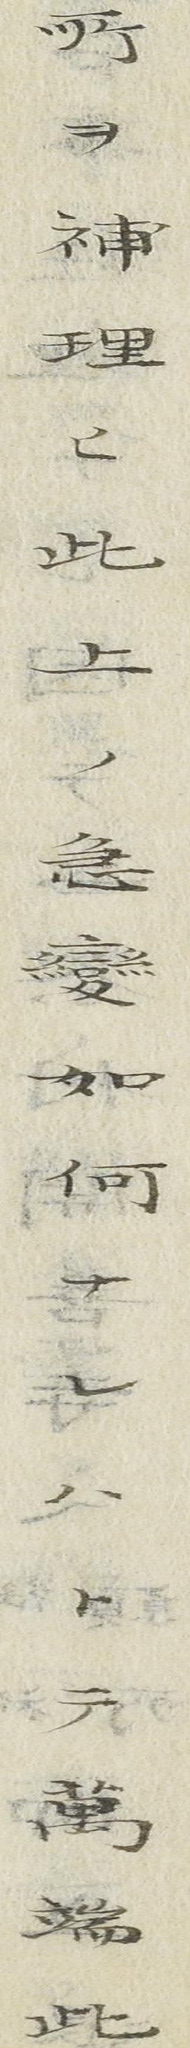所ヲ補理ヒ此上ノ急変如何ナレハトテ万端此
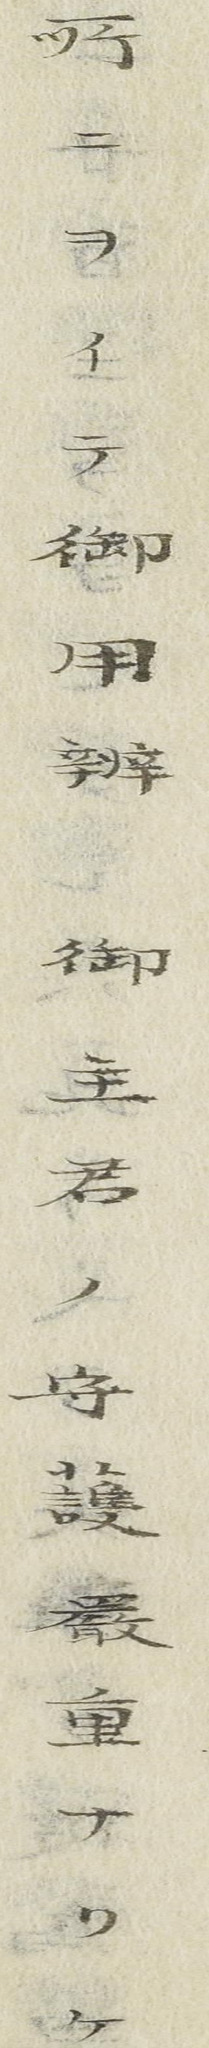所ニヲイテ御用弁御主君ノ守護厳重ナリケ
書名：地災撮要　地震之部　巻ノ二
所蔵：東京大学地震研究所図書室 Earthquake Research Institute Library, The University of Tokyo, JAPAN
